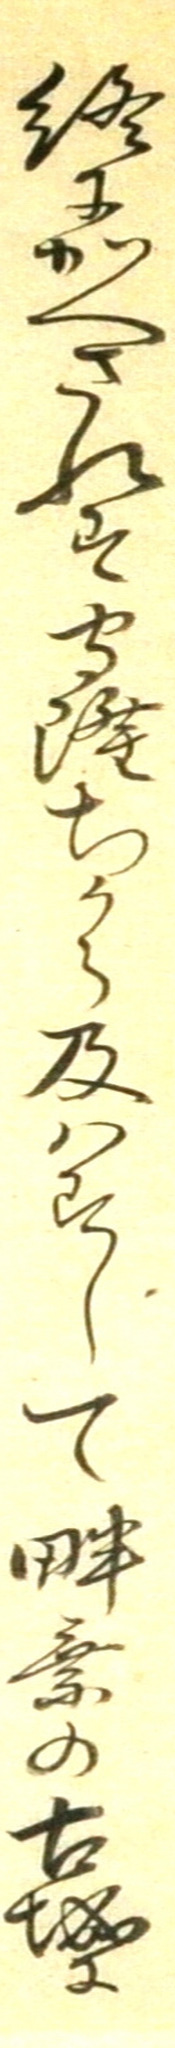終にかへされす守隆ちから及はすして畔乗の古城に
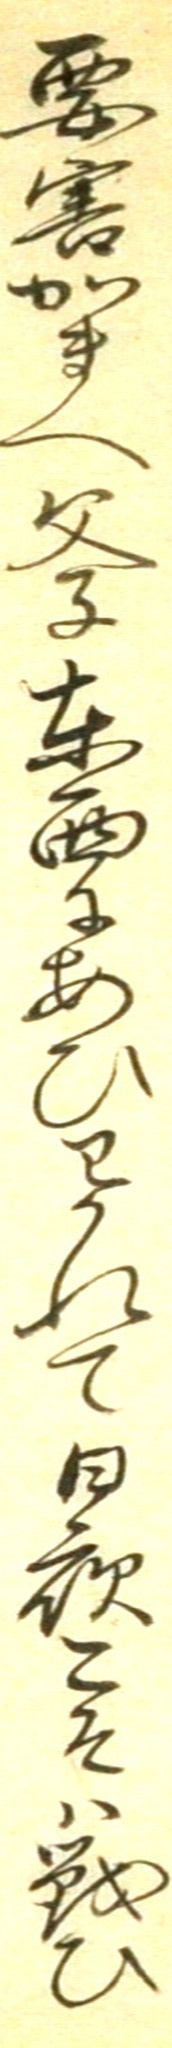要害かまへ父子東西にあひわかれて日夜こそは戦ひ
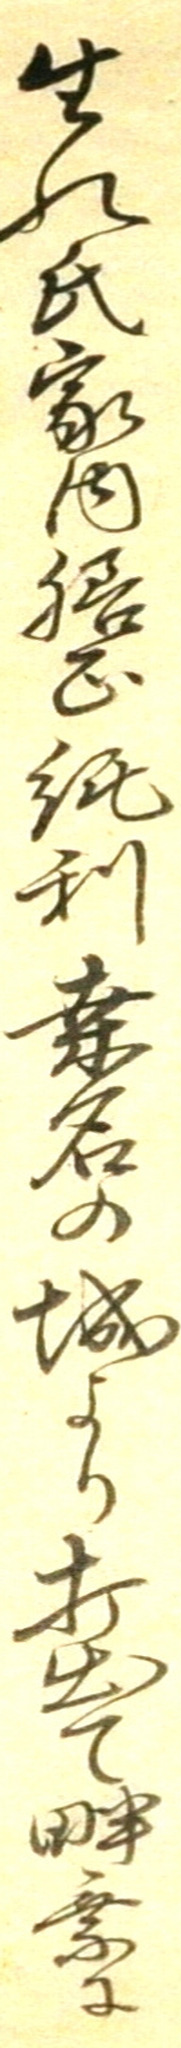生れ氏家内膳正純利乗名の城より打出て畔乗に
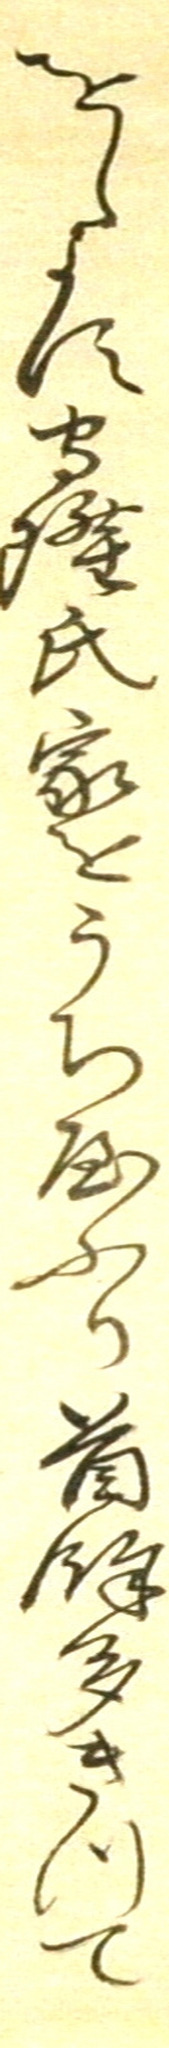をしよす守隆氏家をうちやふり首余多きつて
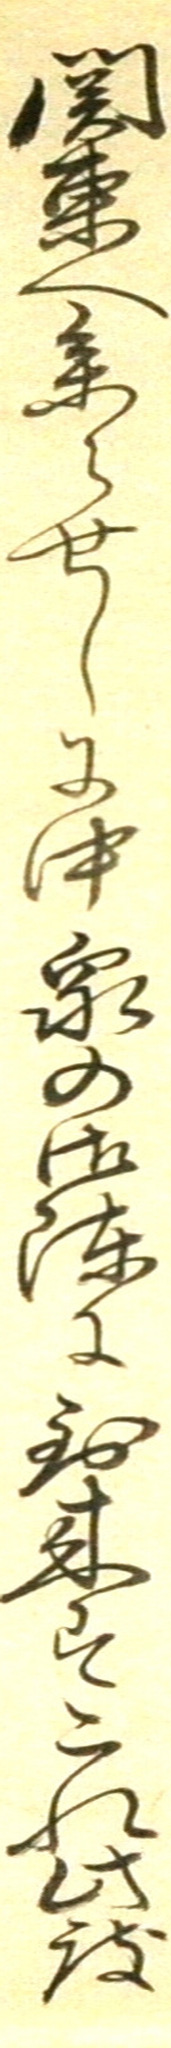関東へ参らせしに中泉の御陣に到来すこれ此度
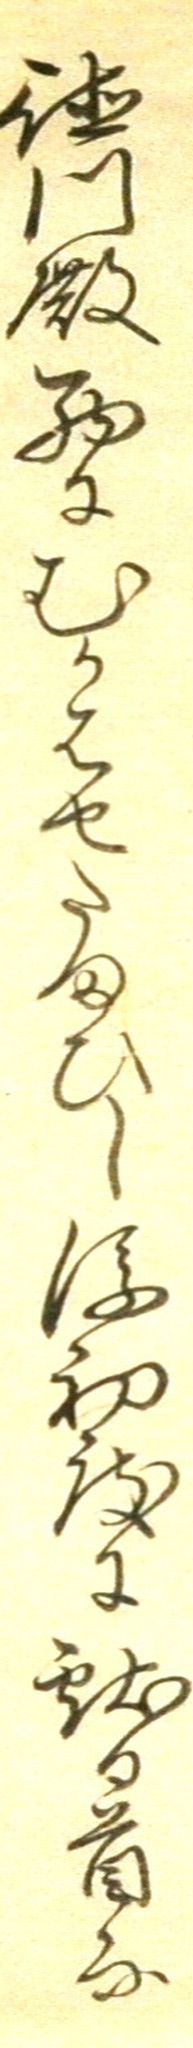徳川殿西にむかはせたまひし後初度に献る首な
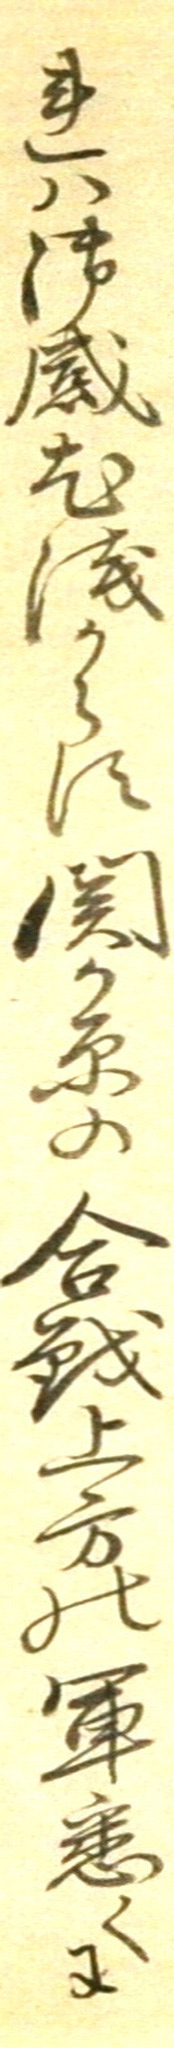れは御感尤浅からす関か原の合戦上方の軍悉くに
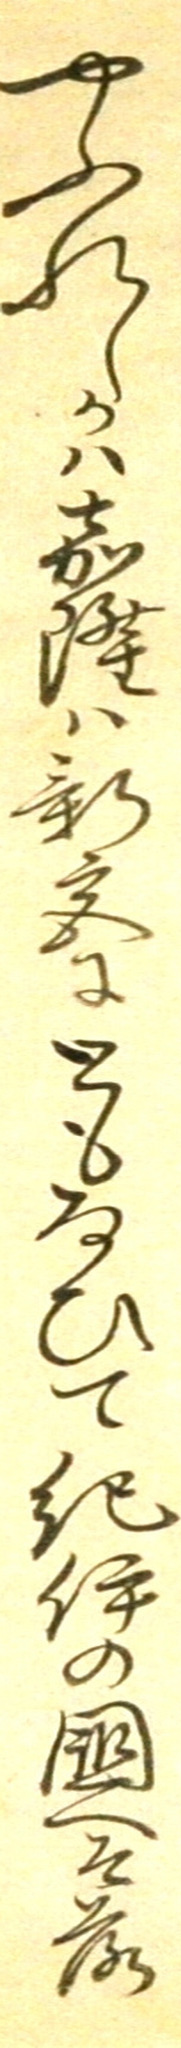やふれしかは嘉隆は新宮にともなひて紀伊の国へそ落
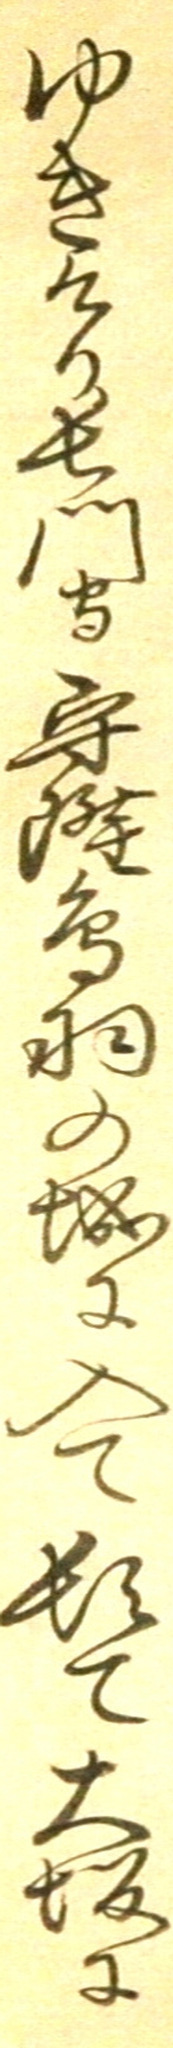ゆきけり長門守守隆鳥羽の城に入て頓て大坂に
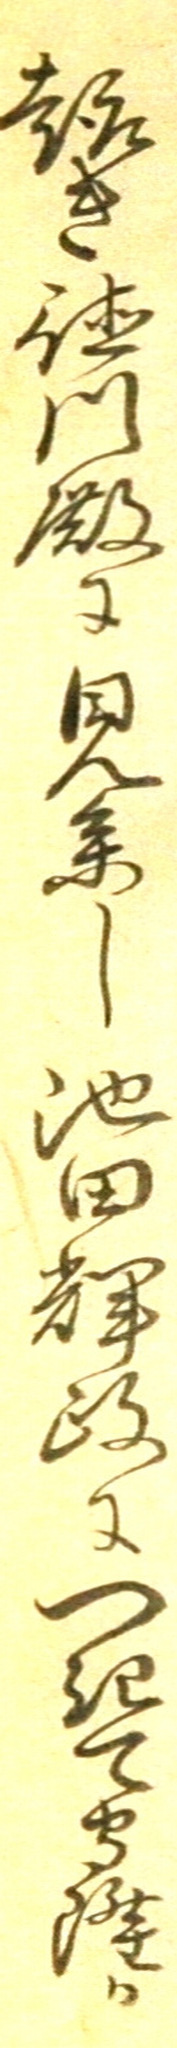趣き徳川殿に見参し池田輝政につきて守隆か

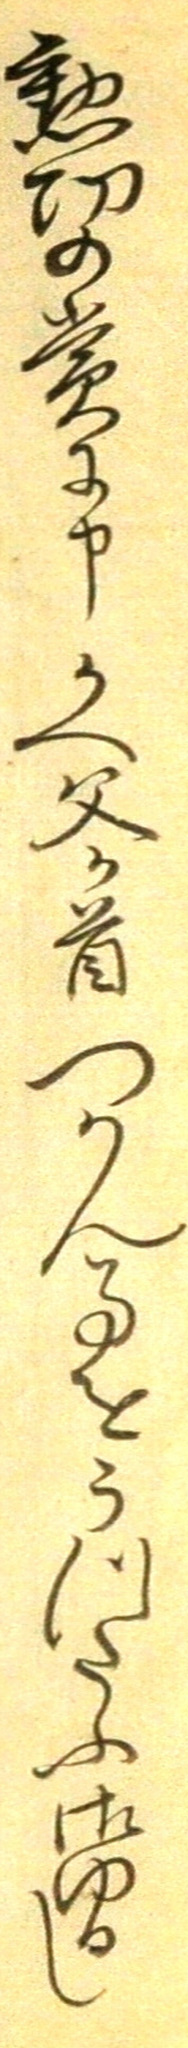勲功の賞に申かへ父か首つかん事をうつたふ御ゆるし
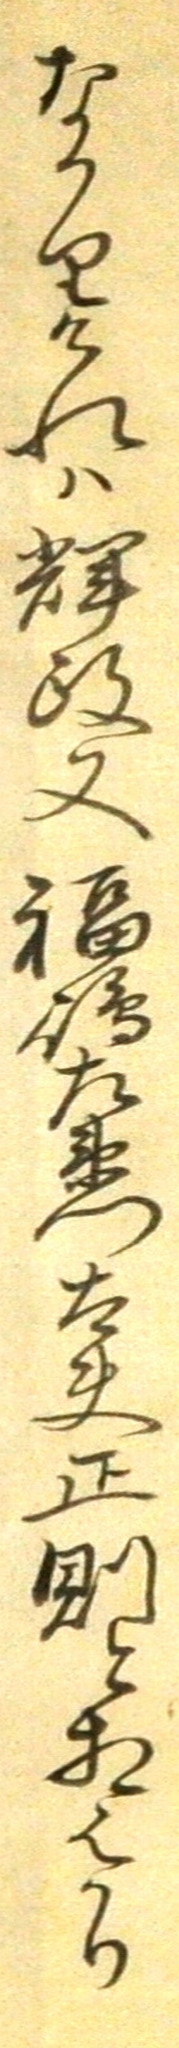なかりけれは輝政又福島左衛門大夫正則と相はかり
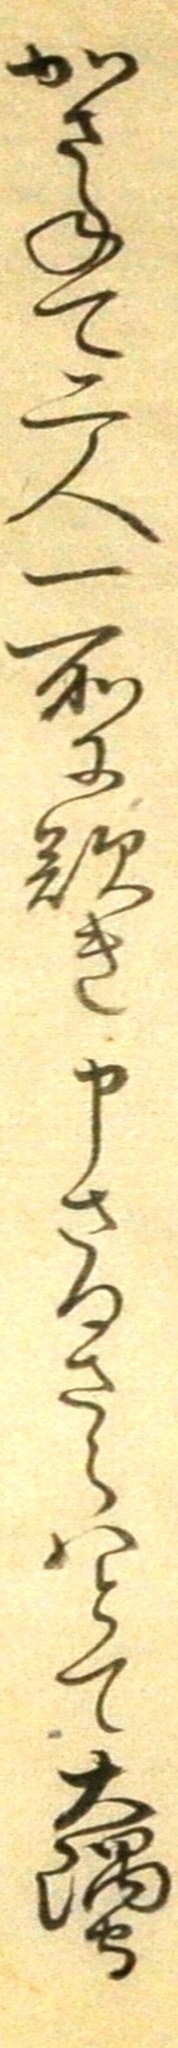かさねて二人一所に歎き申さるさらはとて大隅守
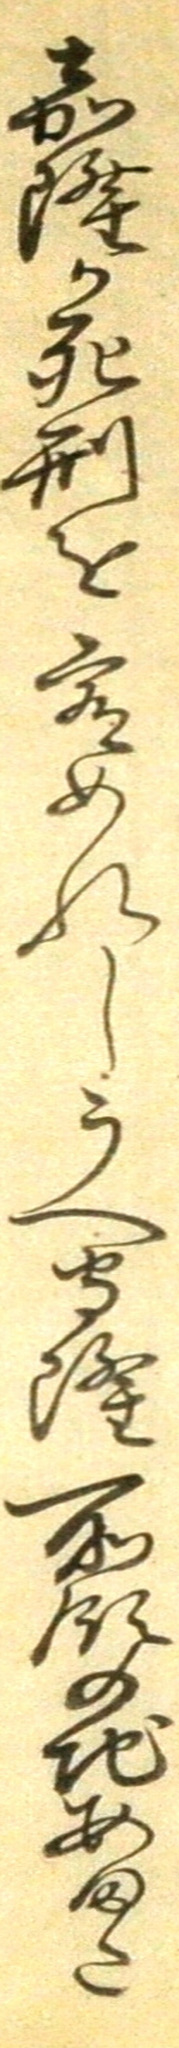嘉隆か死刑を宥めれしうへ守隆所領の地あまた
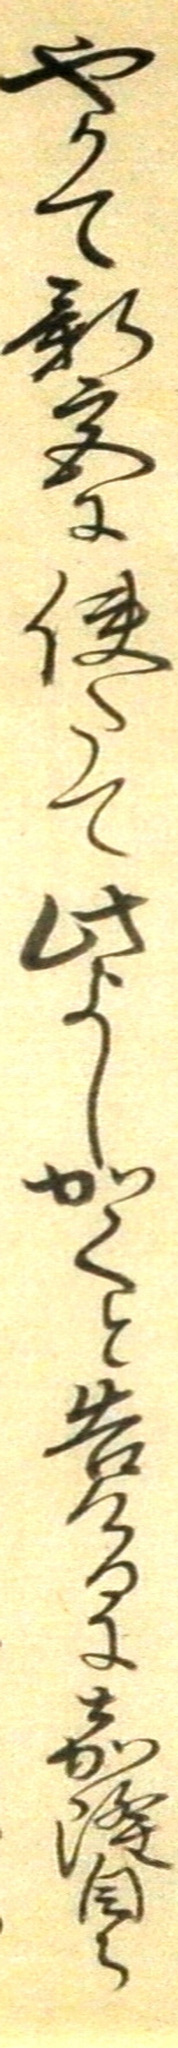やかて新宮に使たて此よしかくと告けるに嘉隆自ら

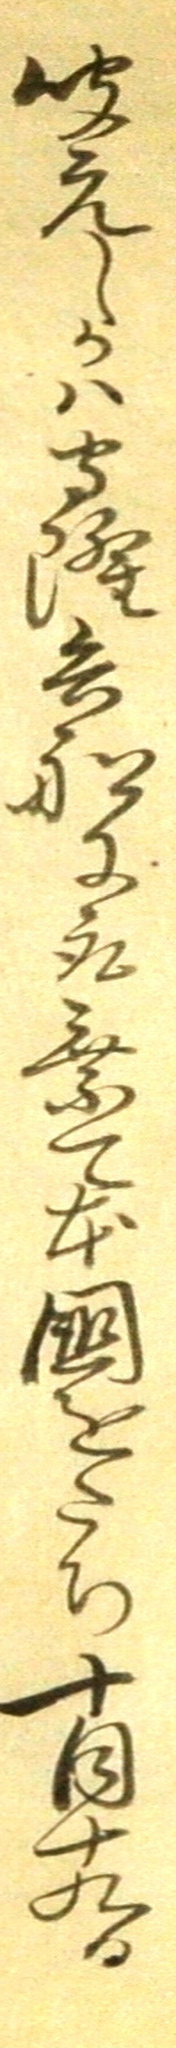聞えしかは守隆兵船に取乗て本国をたち十月十九日
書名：藩翰譜（九・上）
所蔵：伊那市立高遠町図書館・合同会社AMANE
